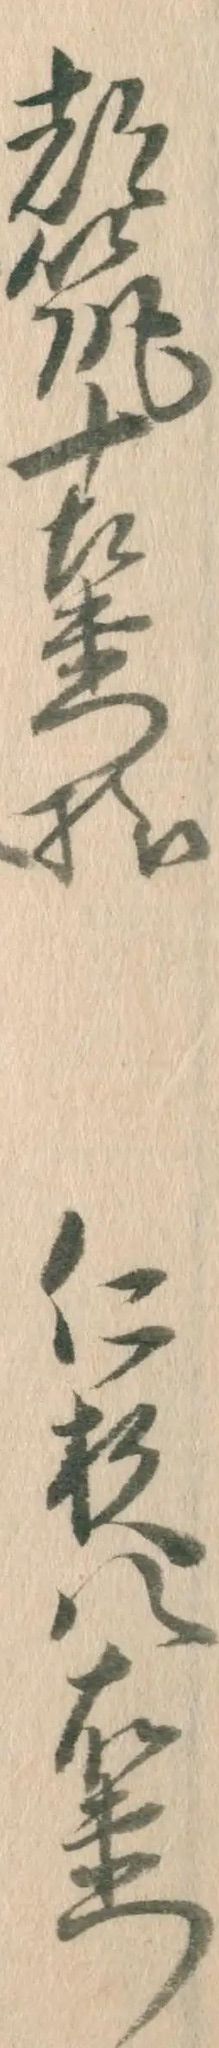都筑十左衛門様仁杉八右衛門
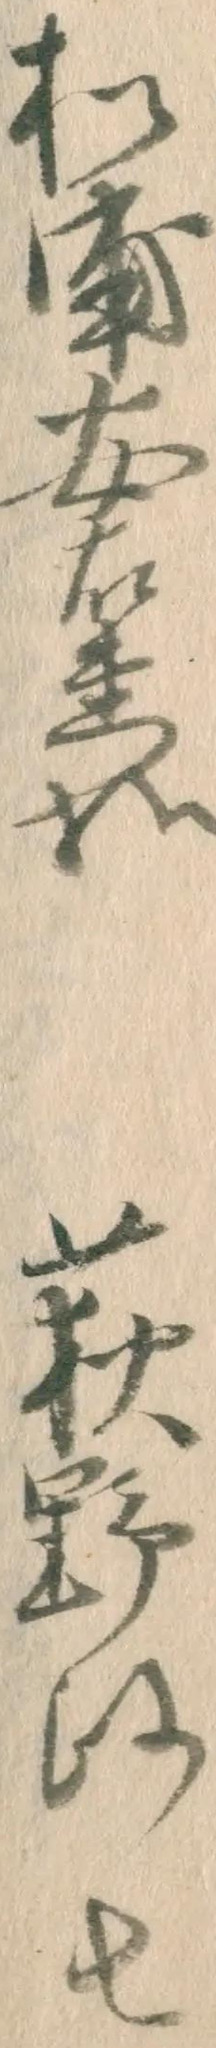松浦安右衛門様荻野政七
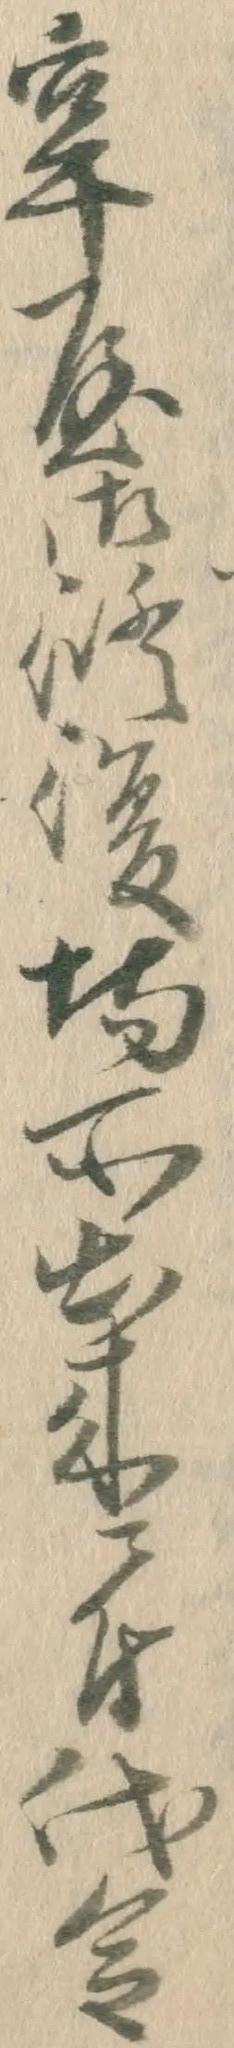牢屋御修復場所出来ニ付代金
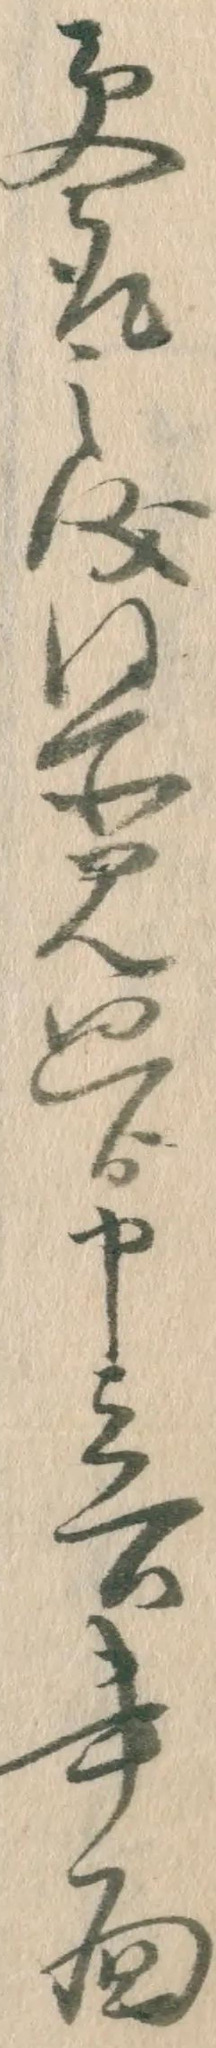受取之儀同所見廻ゟ申立候書面
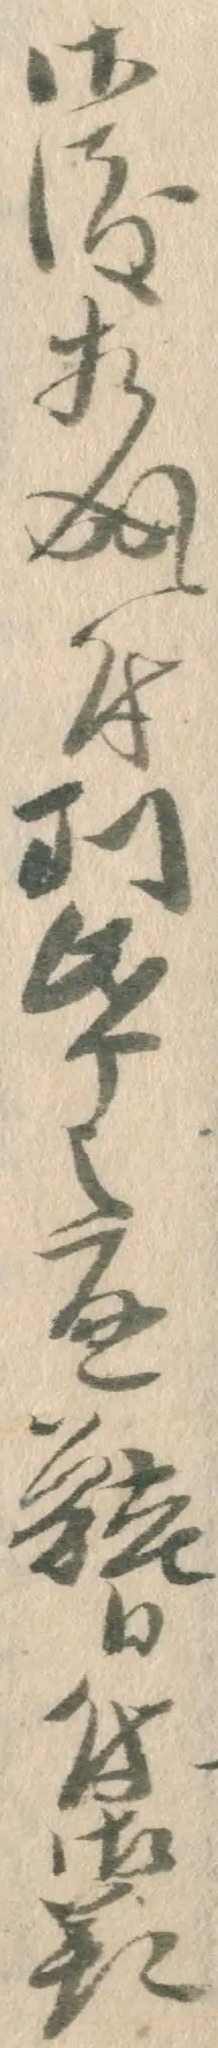御渡相成ニ付別紙之通鰭付御差
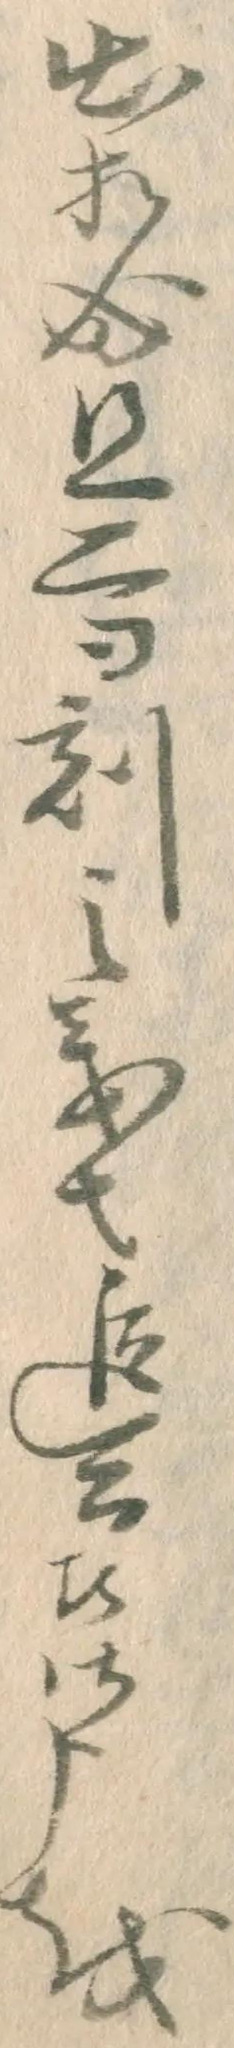出相成且二ツ割之義は追て被御申越
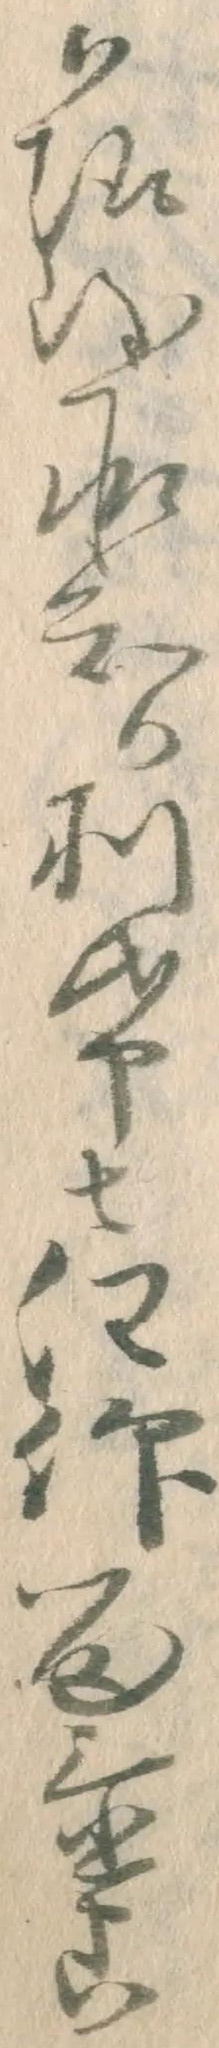下趣致承知候別紙は任被留置申候

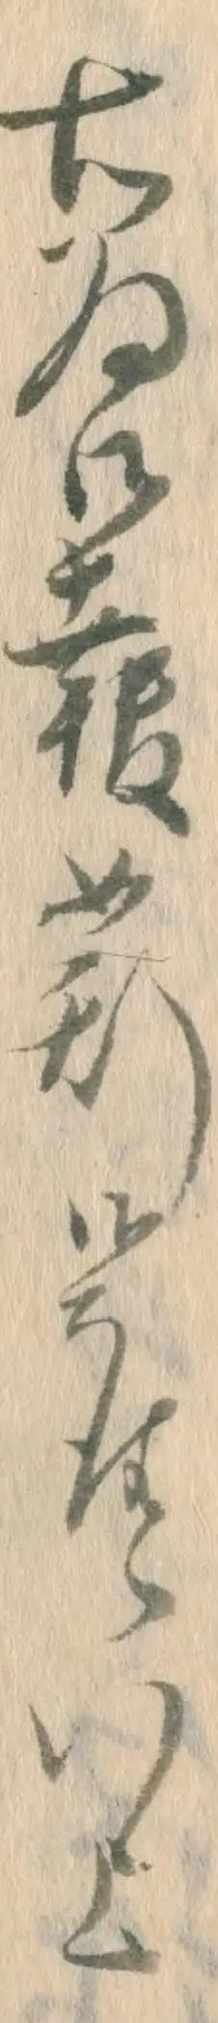右為御報如斯御座候以上
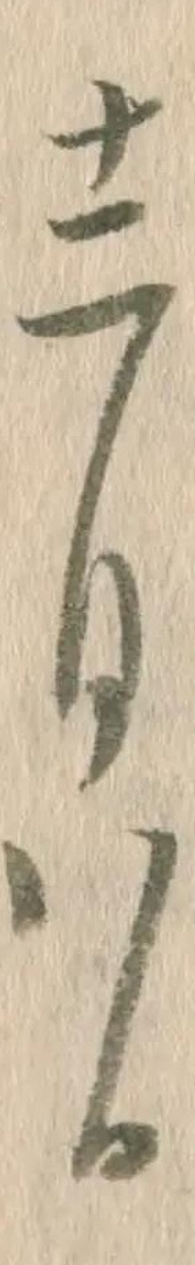十二月八日
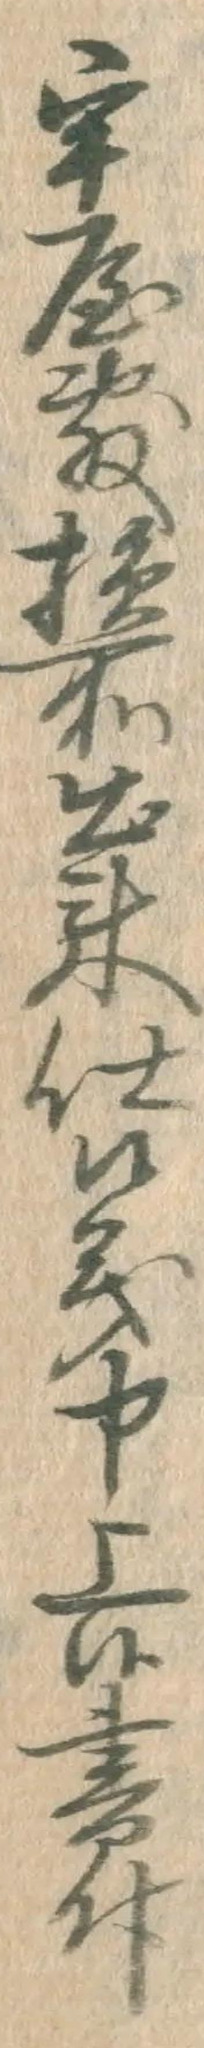│牢屋敷損所出来仕候義申上候書付
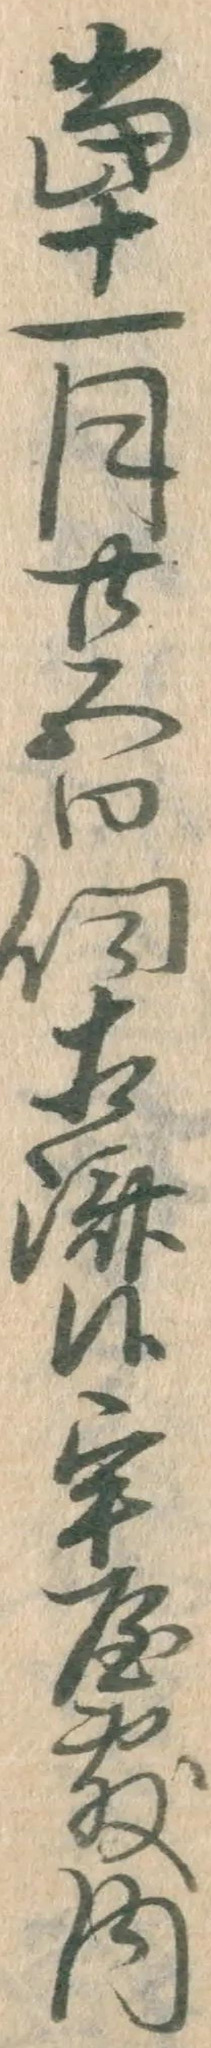当十一月廿五日伺相済候牢屋敷内
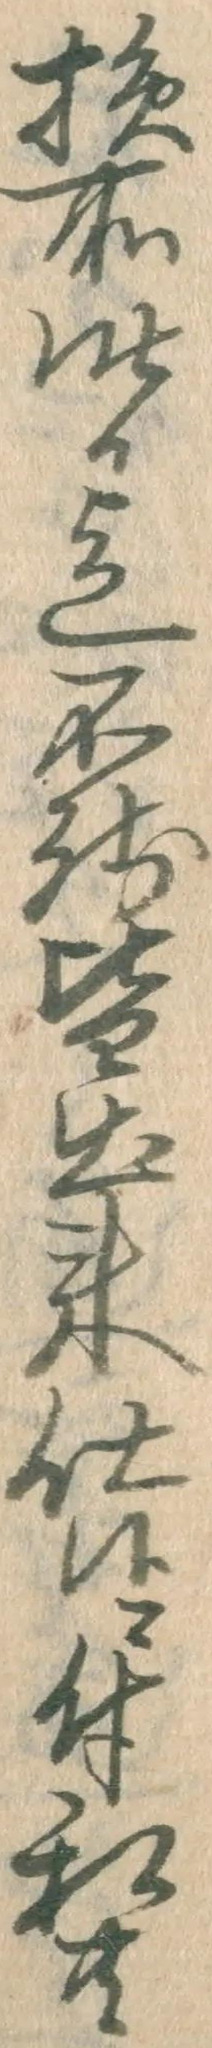損所昨日迄不残皆出来仕候ニ付私共

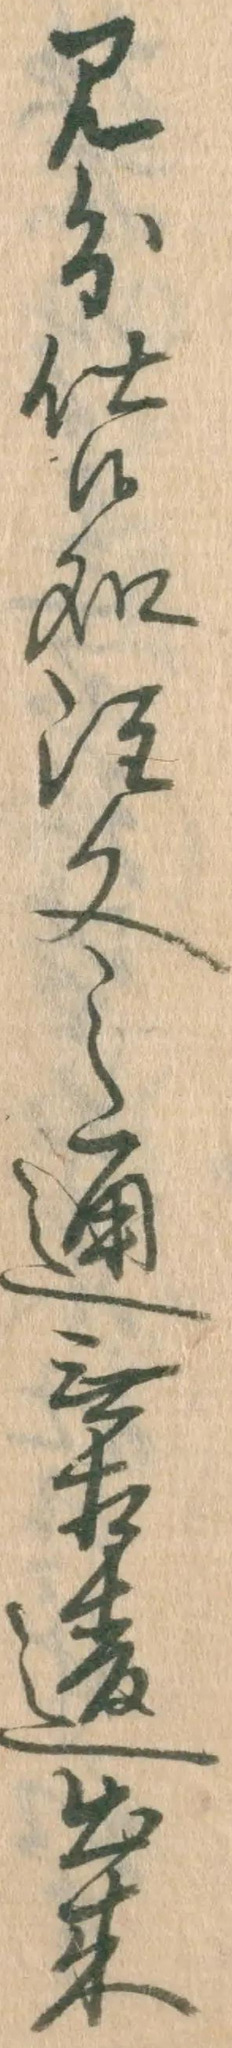見分仕候処注文之通無相違出来
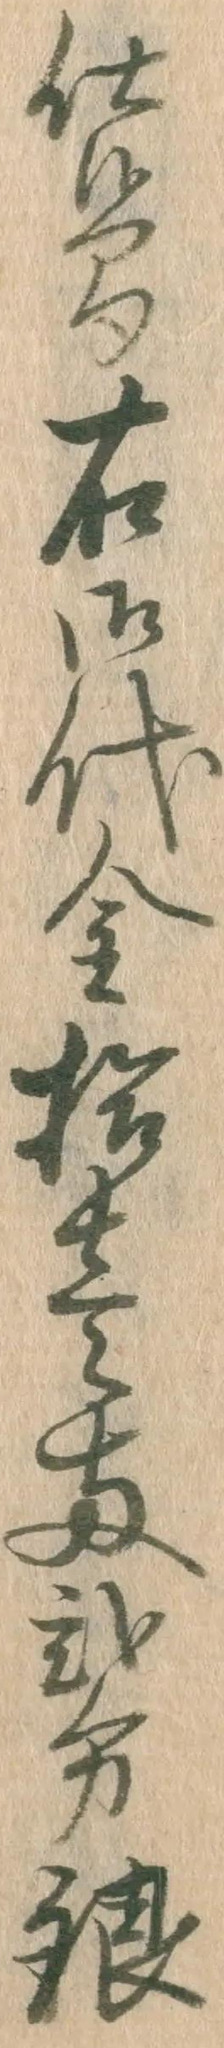仕候間右御代金拾壱両弐分銀
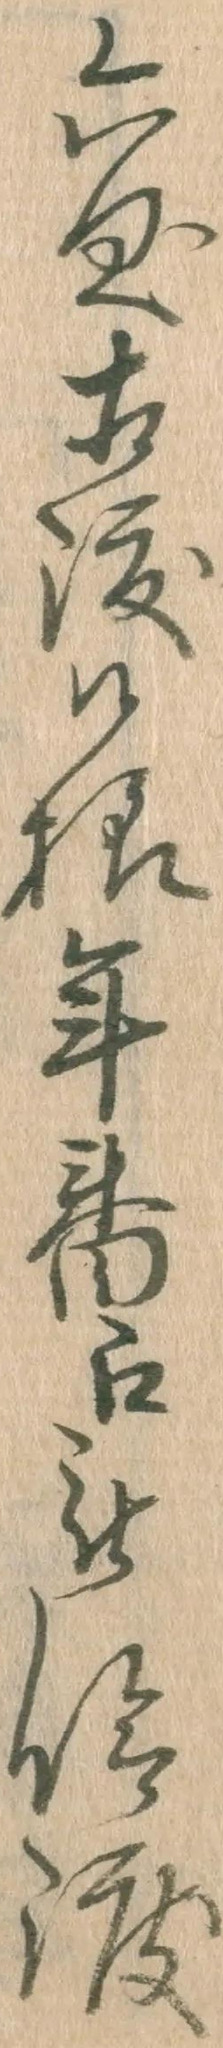六匁相渡候様年番え被仰渡
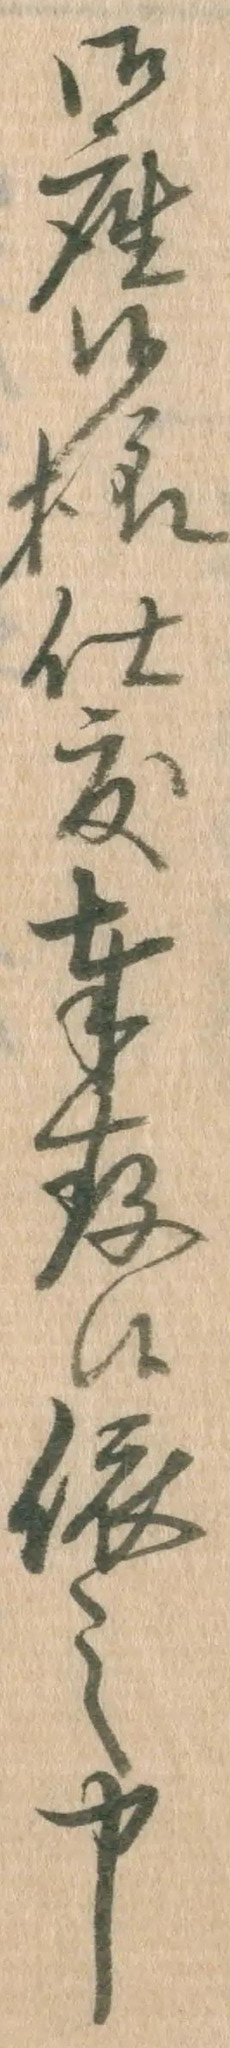御座候様仕度奉存候依之申
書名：七十冊物類集 71巻. [44] 四十三 牢屋敷御普請御修覆地震ニ付骨折候牢屋掛御褒美之部
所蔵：国立国会図書館 National Diet Library, JAPAN
